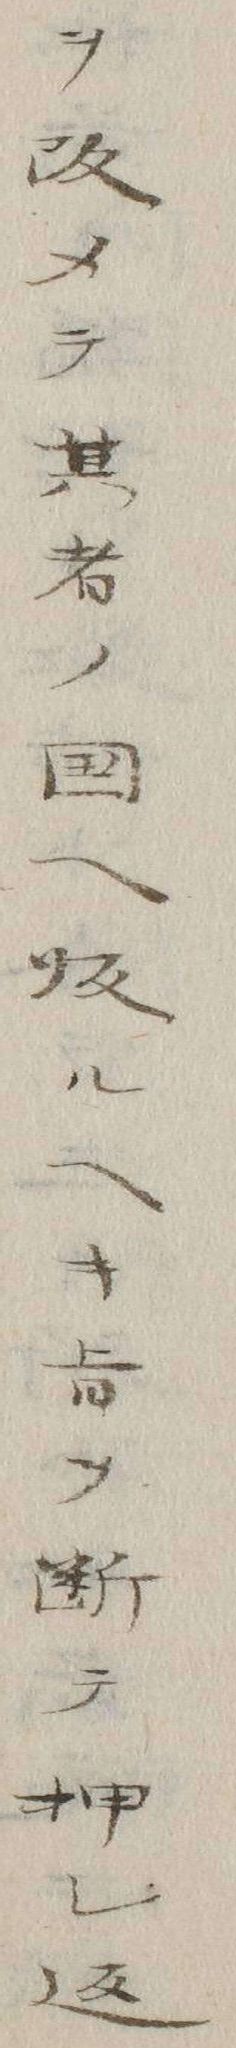ヲ改メテ其者ノ国ヘ帰ルヘキ旨ヲ断テ押シ返
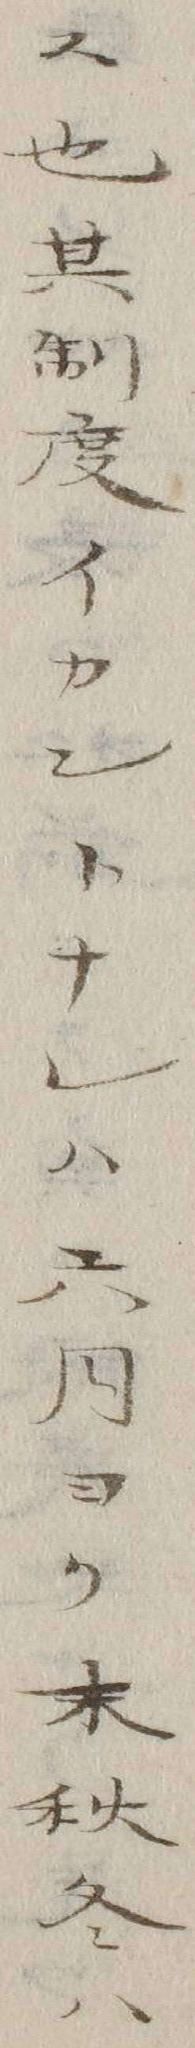ス也其制度イカントナレハ六月ヨリ末秋冬ハ
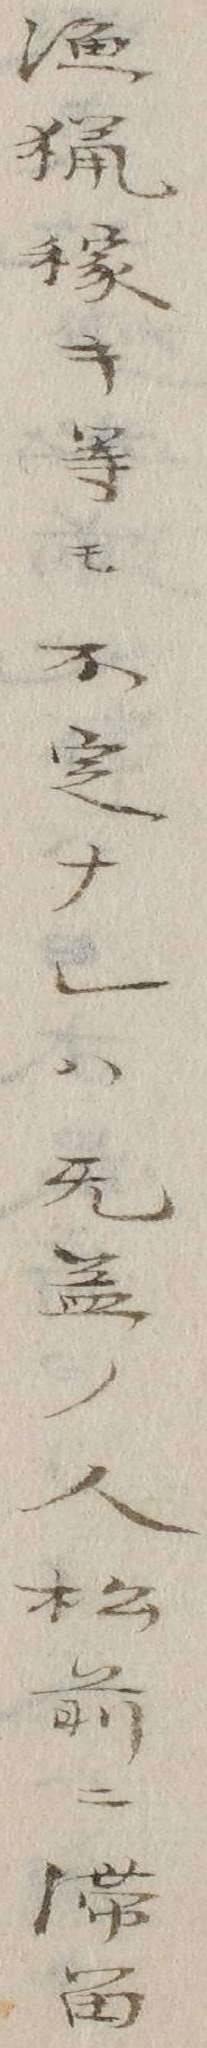漁猟稼キ等モ不定ナレハ旡恙ノ人松前ニ滞留
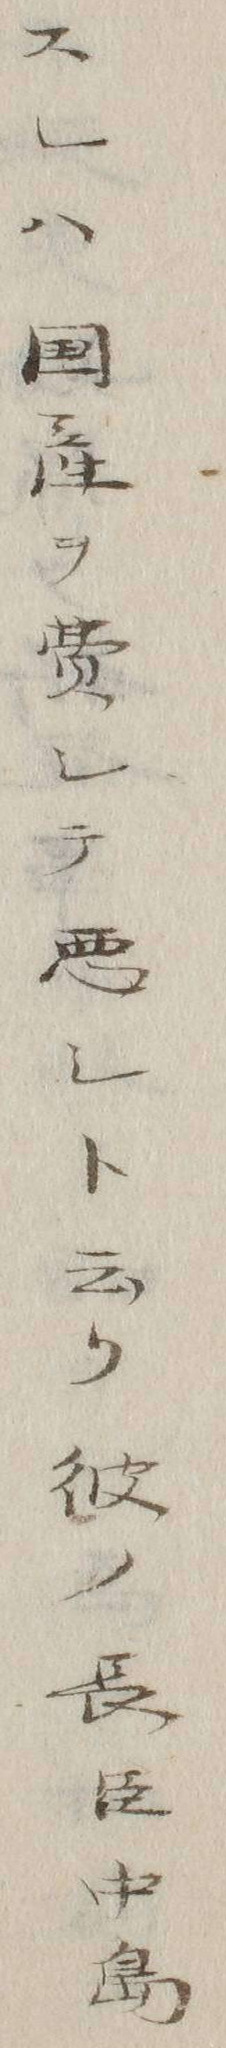スレハ国産ヲ費シテ悪シト云リ彼ノ長臣中島
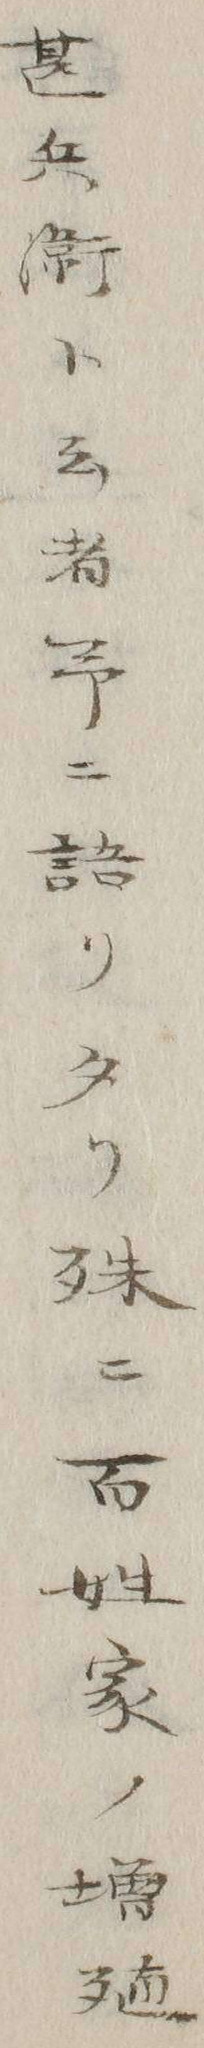甚兵衛ト云者予ニ語リタリ殊ニ百姓家ノ増殖
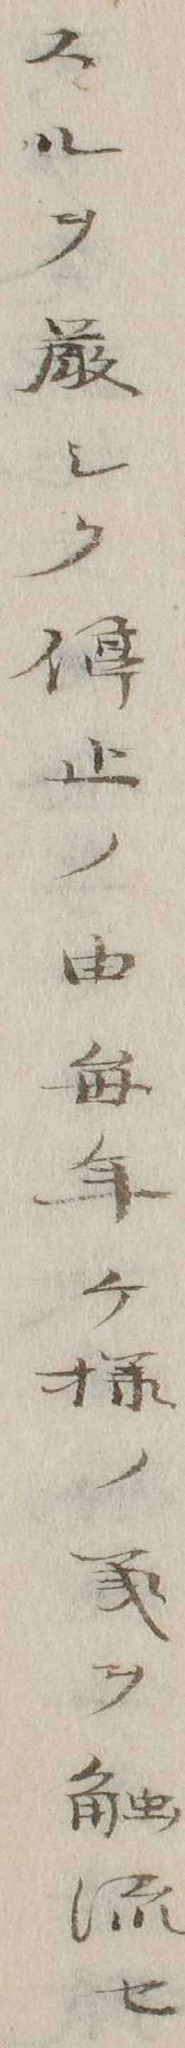スルヲ厳シク停止ノ由毎年ケ様ノ義ヲ触流セ
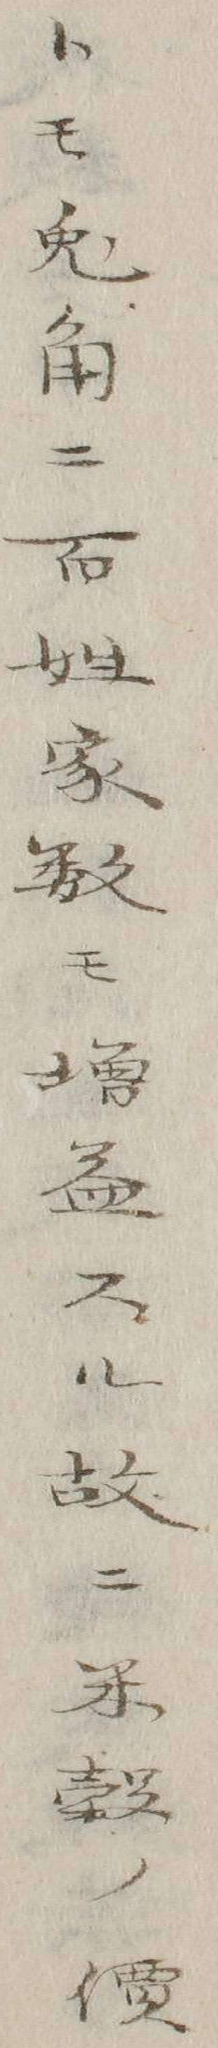トモ兎角ニ百姓家数モ増益スル故ニ米穀ノ価
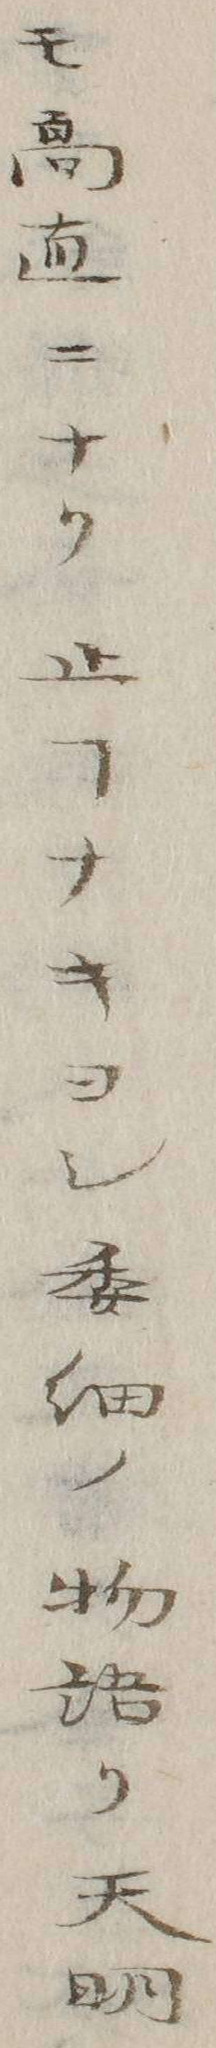モ高直ニナリ止ヿナキヨシ委細ノ物語リ天明
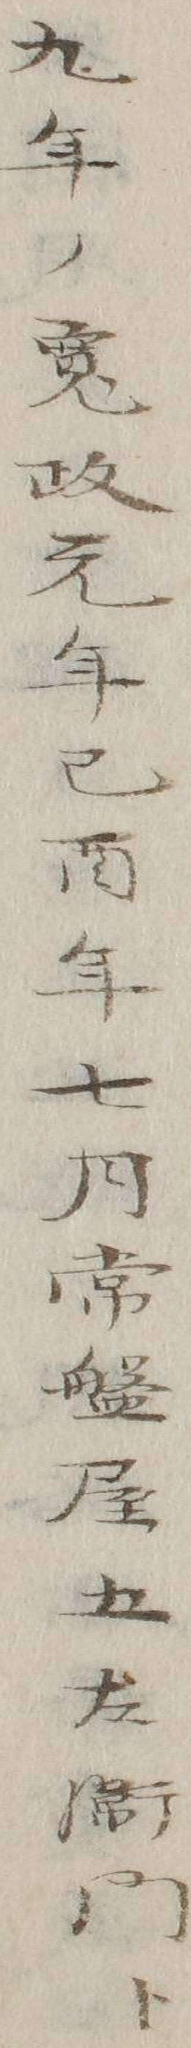九年ノ寛政元年己酉年七月常盤屋五左衛門ト
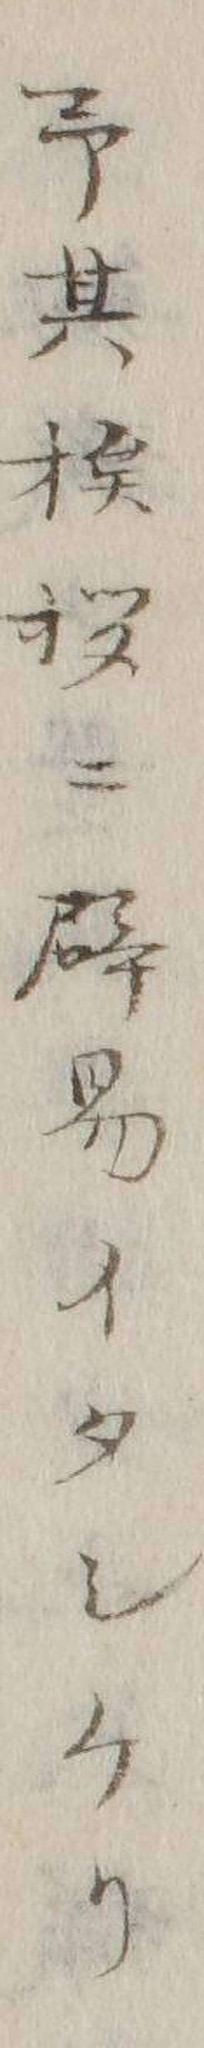予其挨拶ニ辟易イタシケリ
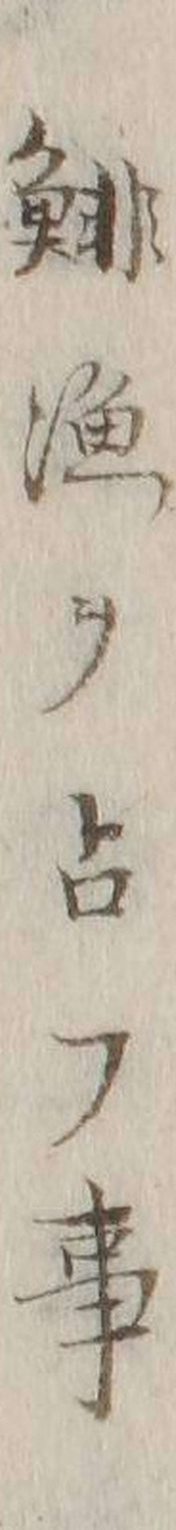鯡漁ヲ占フ事
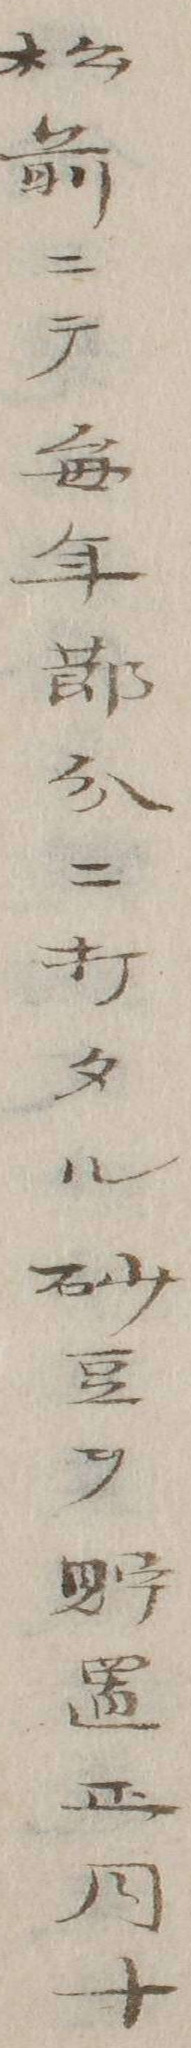松前ニテ毎年節分ニ打タル砂豆ヲ貯置正月十
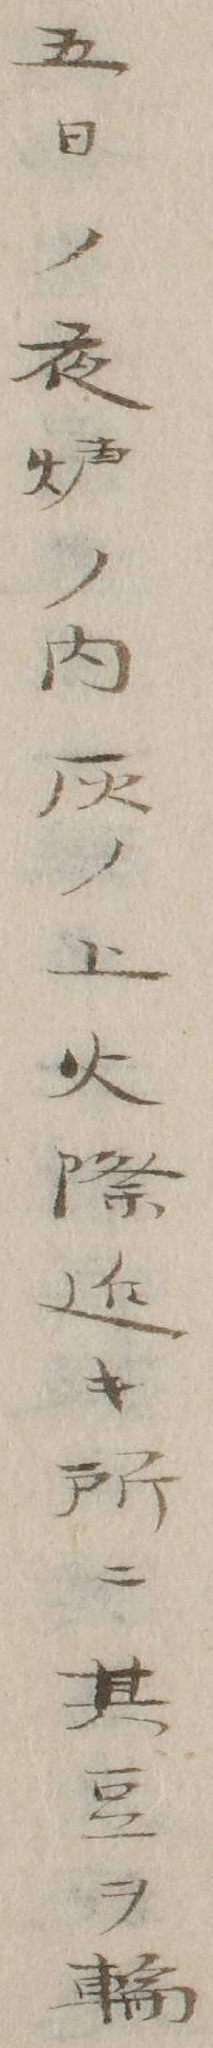五日ノ夜炉ノ内灰ノ上火際近キ所ニ其豆ヲ輪

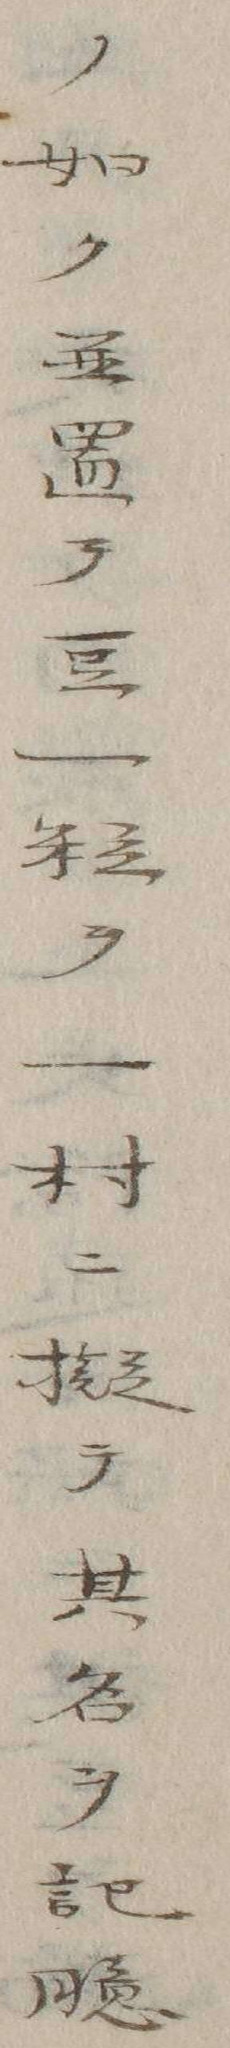ノ如ク並置テ豆一粒ヲ一村ニ擬テ其名ヲ記憶
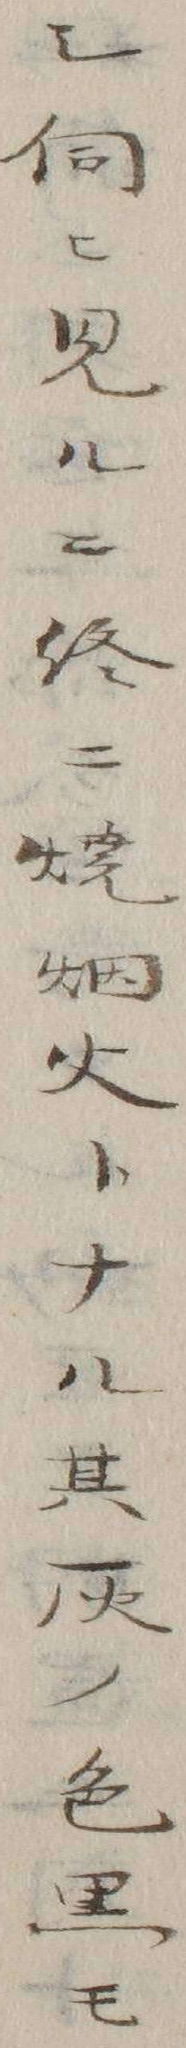シ伺ヒ見ルニ終ニ焼煙火トナル其灰ノ色黒モ
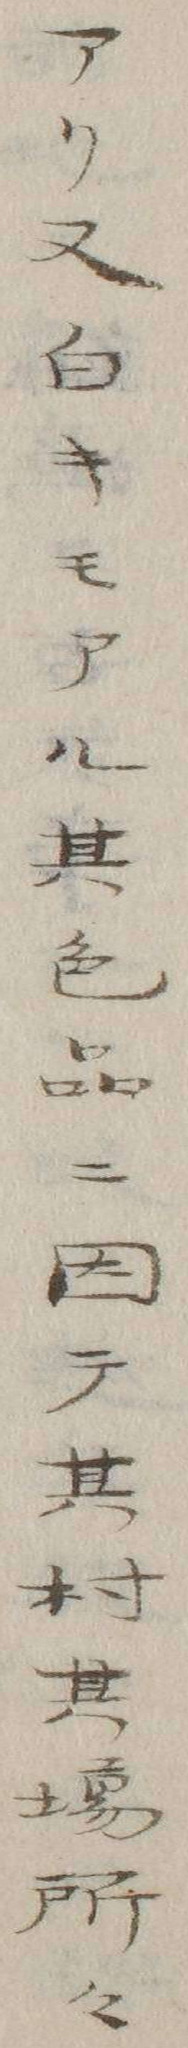アリ又白キモアル其色品ニ因テ其村其場所々
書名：蝦夷草紙（国文学研究資料館）
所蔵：国文学研究資料館
